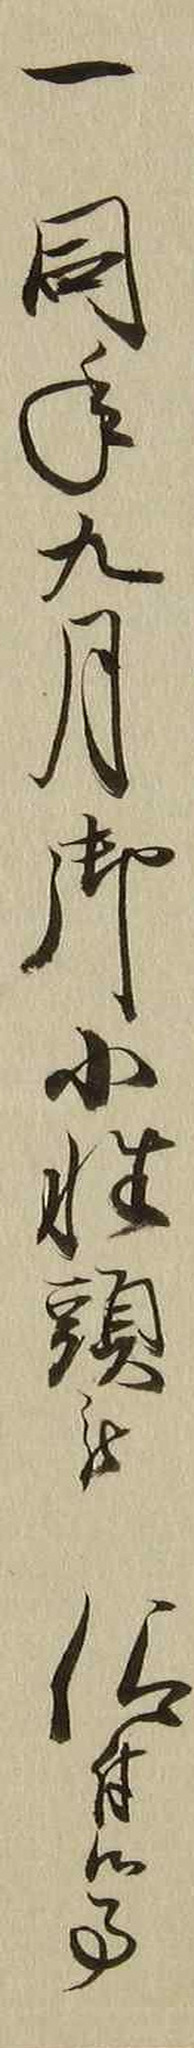一同年九月御小性頭被仰付候事
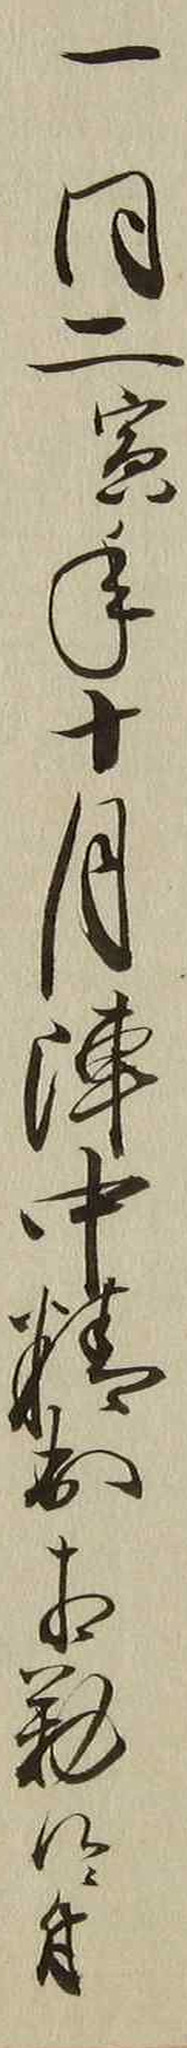一同二寅年十月陣中精出相勤候に付
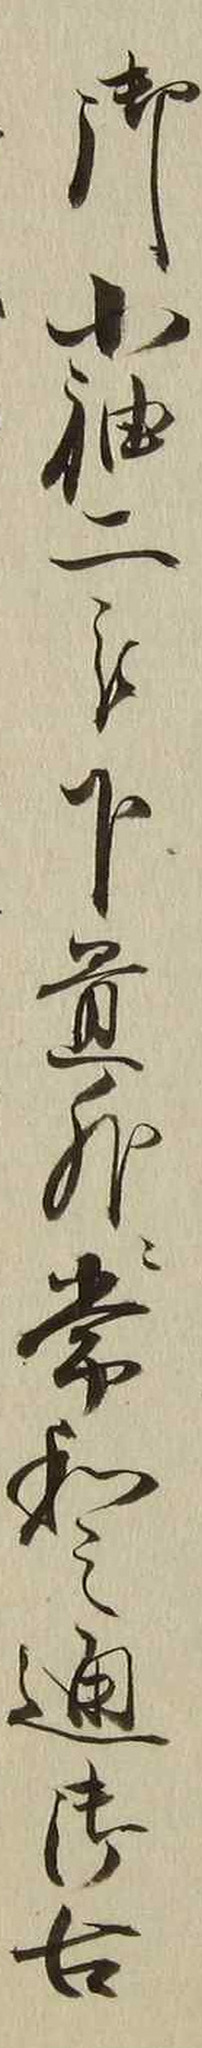御小袖二被下置外に常和之通御古
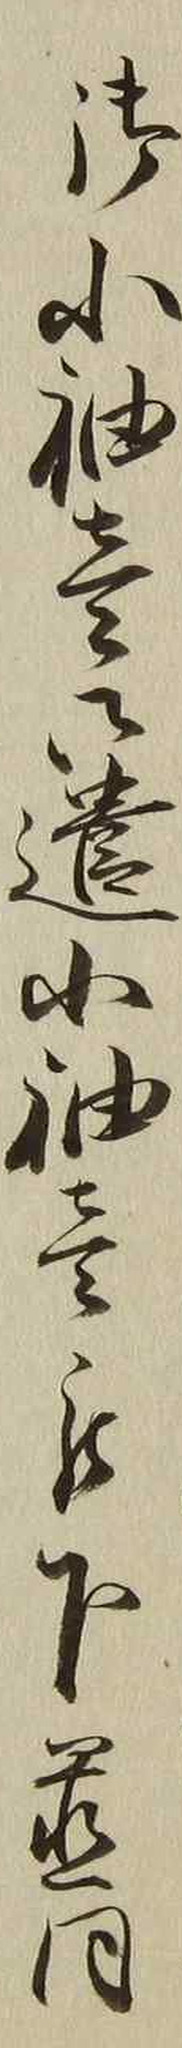御小袖壱御遣小袖壱被下置同
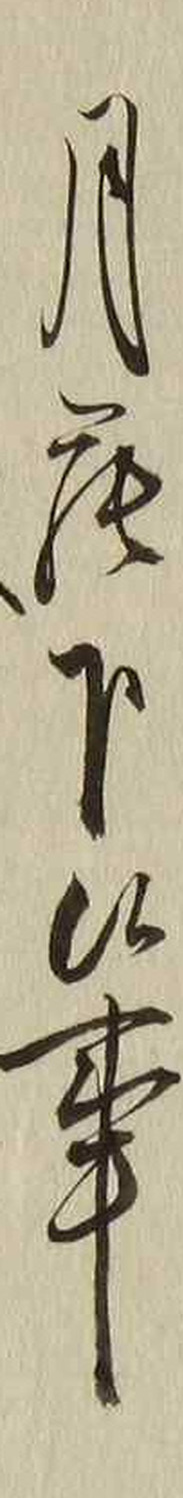月罷下候事
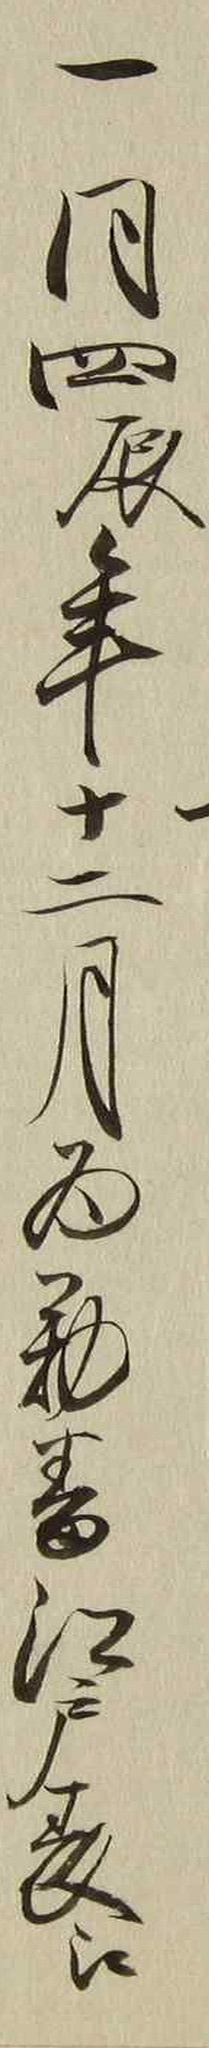一同四辰年十二月為勤番江戸表江
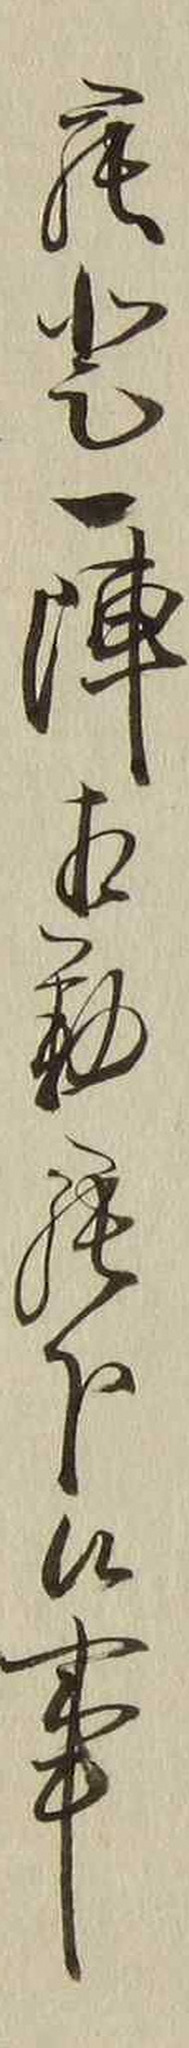登一陣相勤罷下候事
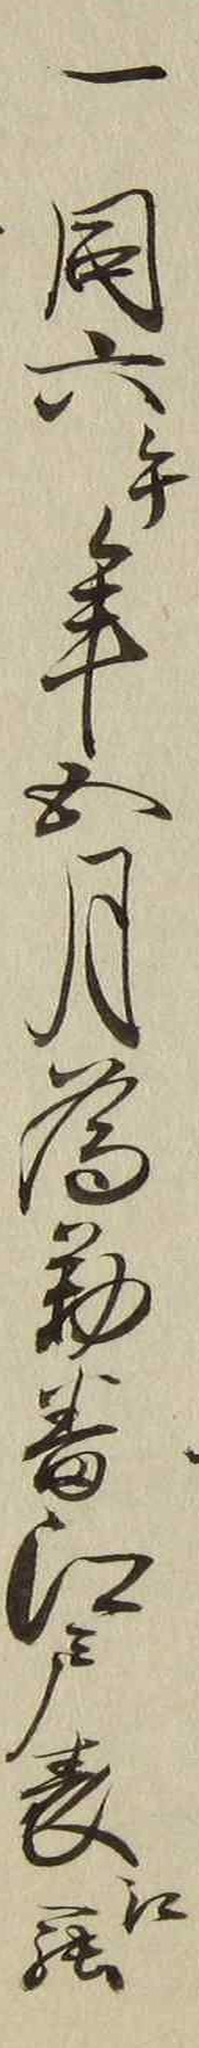一同六午年五月為勤番江戸表江罷
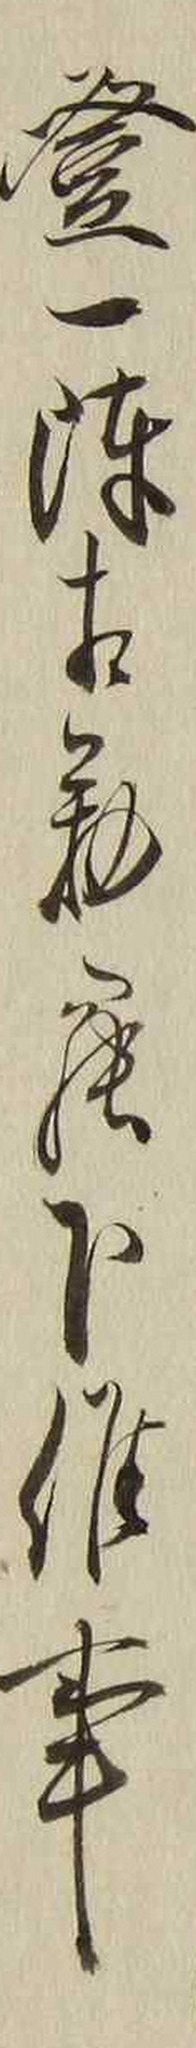登一陣相勤罷下候事
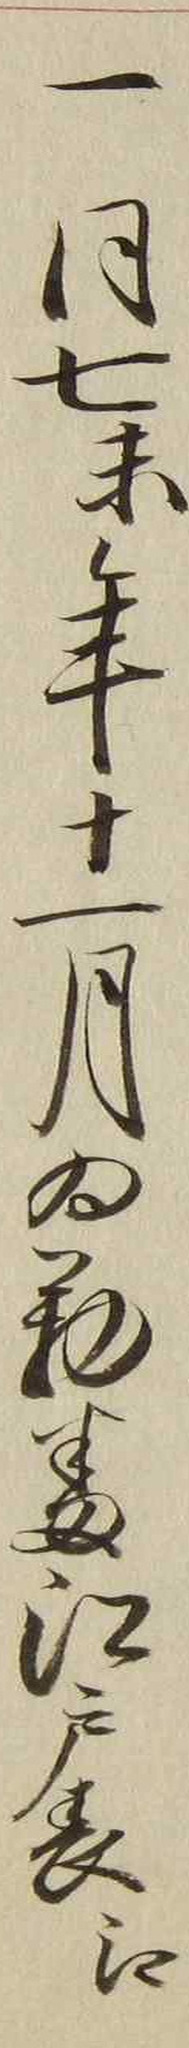一月七未年十一月為勤番江戸表江
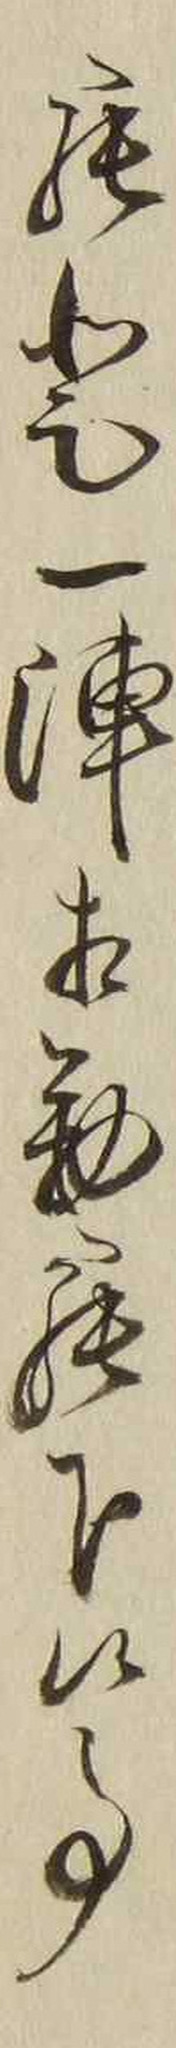罷登一陣相勤罷下候事

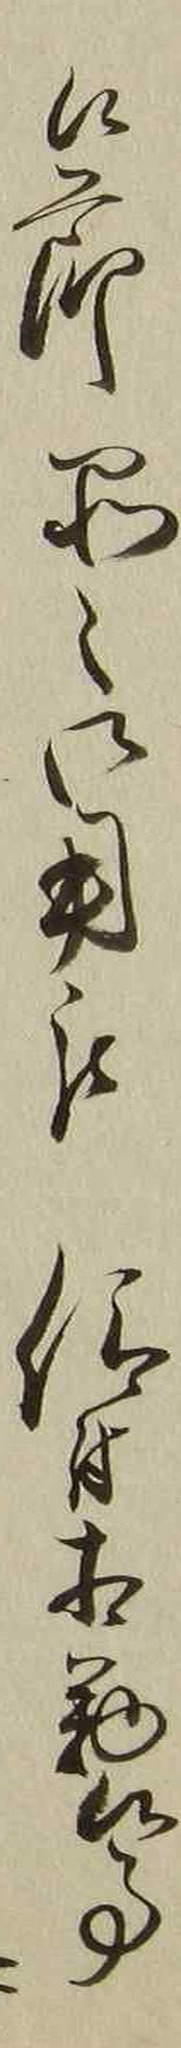候節品々御用被仰付相勤候事
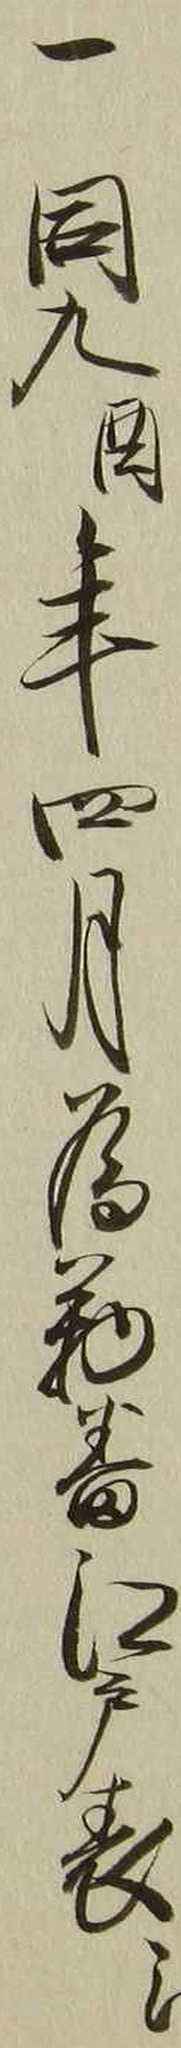一同九酉年四月為勤番江戸表江
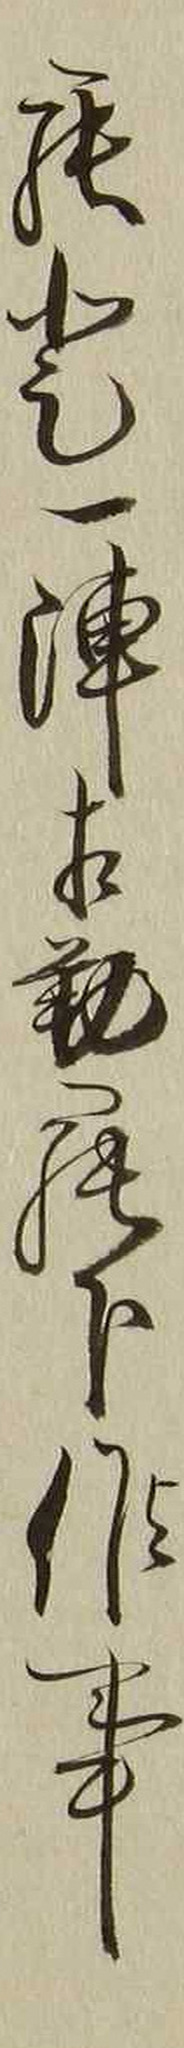罷登一陣相勤罷下候事
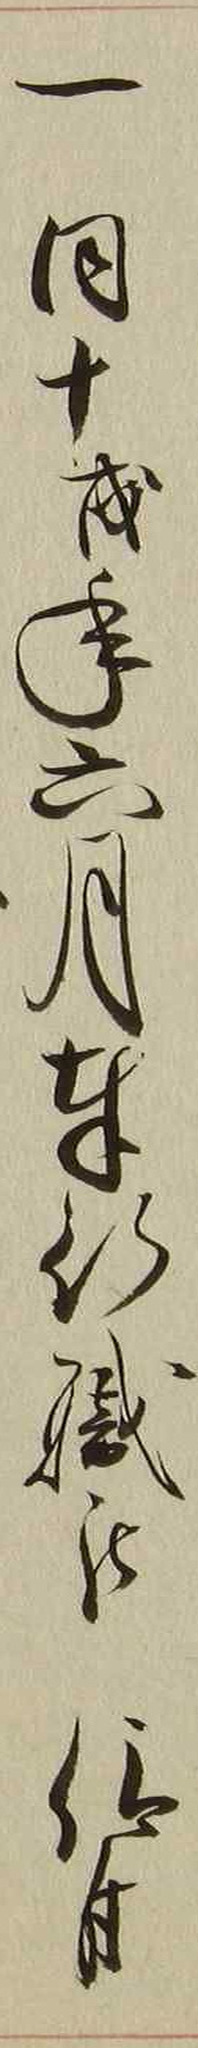一同十戌年六月奉行職被仰付
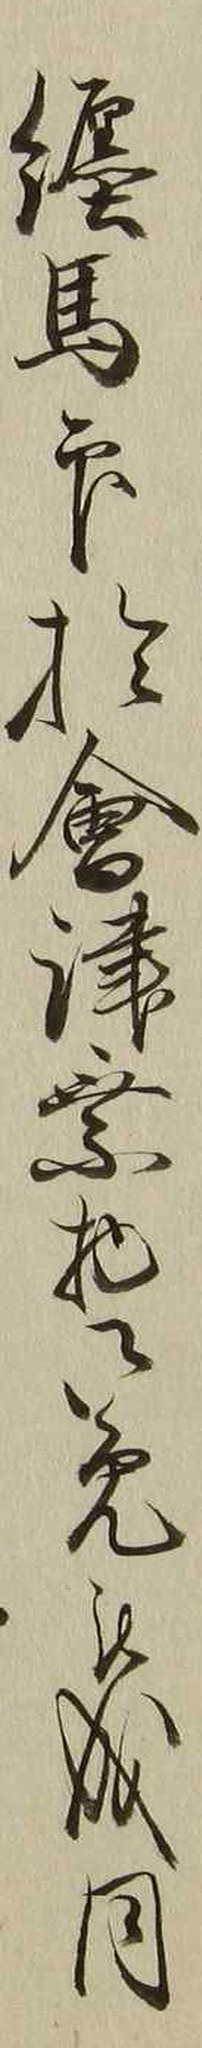纏馬印於会津乗物御免被成同
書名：諸士系譜　巻之77　を之部11
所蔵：会津若松市立会津図書館
